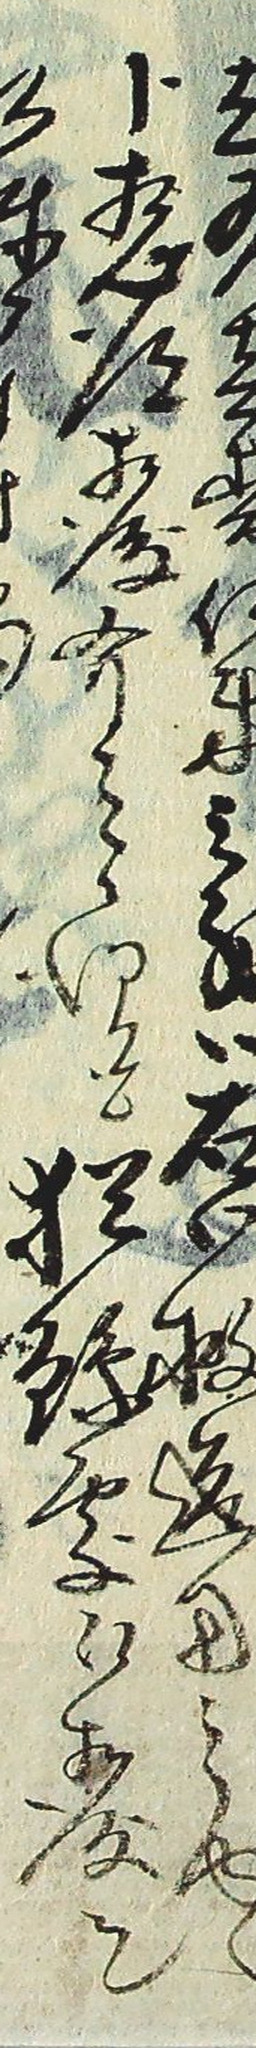と相心得相渡有之候得とも猶予処え相渡し
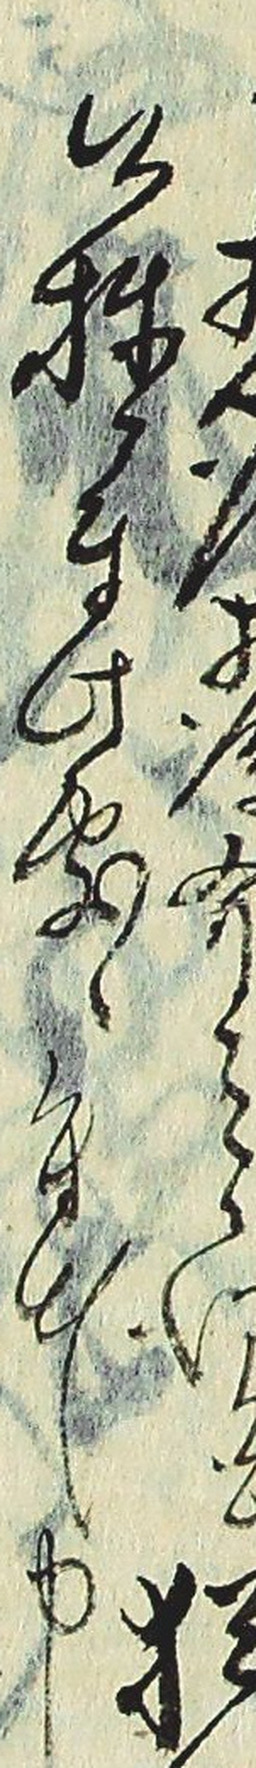候株に付此処へ付出し申候
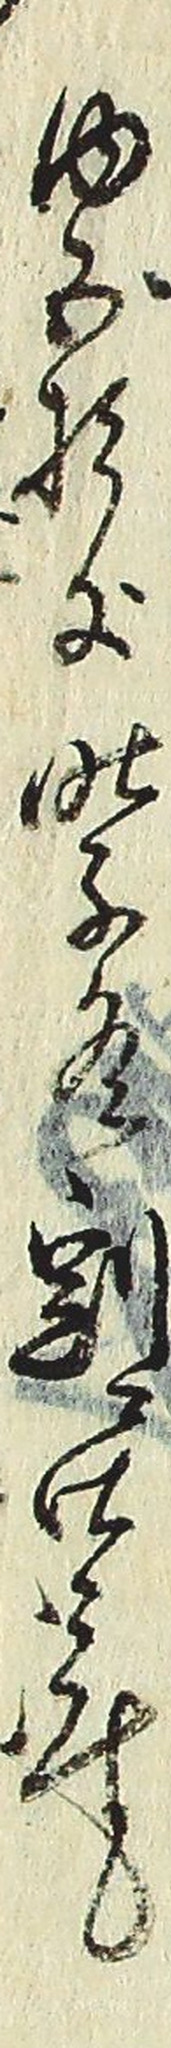内五拾匁昨子冬割に仕御座候
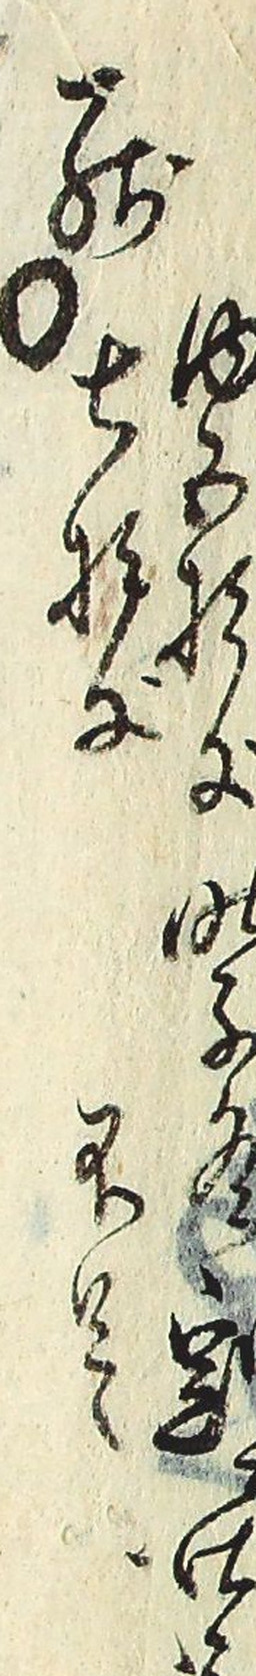残七拾匁不足

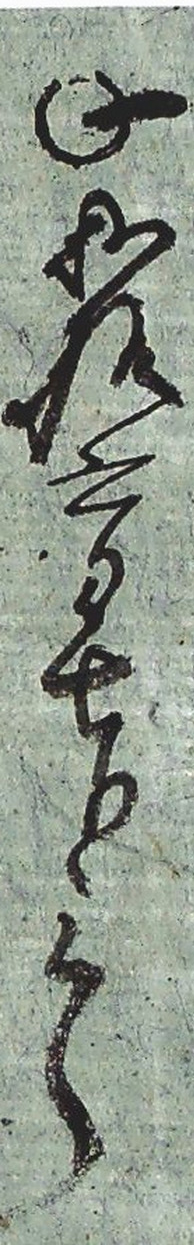一弐拾六匁七分三厘
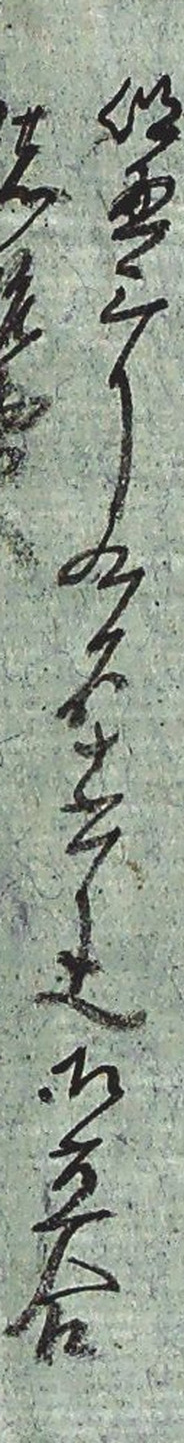但丑三月九日ゟ十六日迄御立合
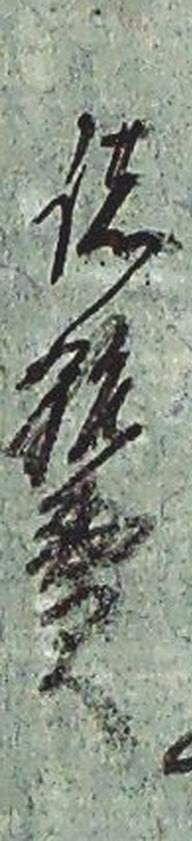諸雑費
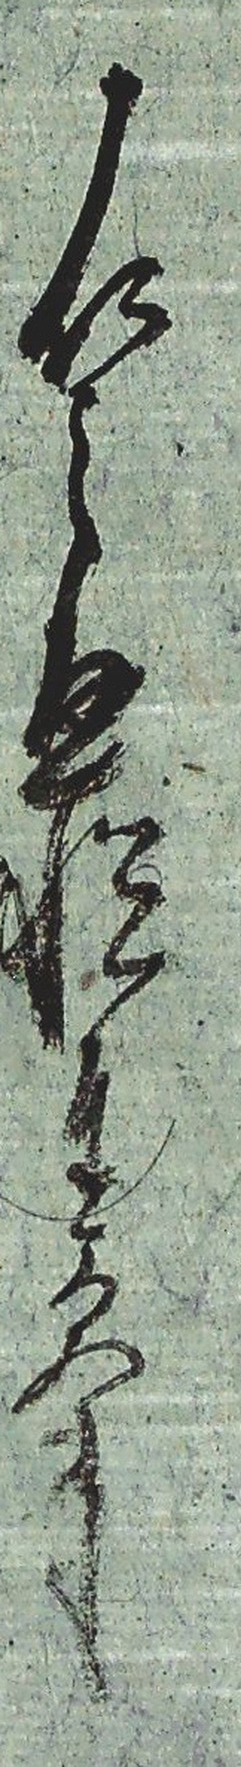右之通慥奉受取候
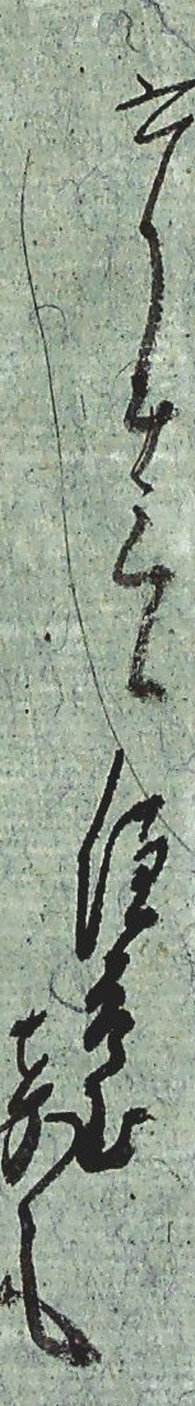六月十三日住吉屋
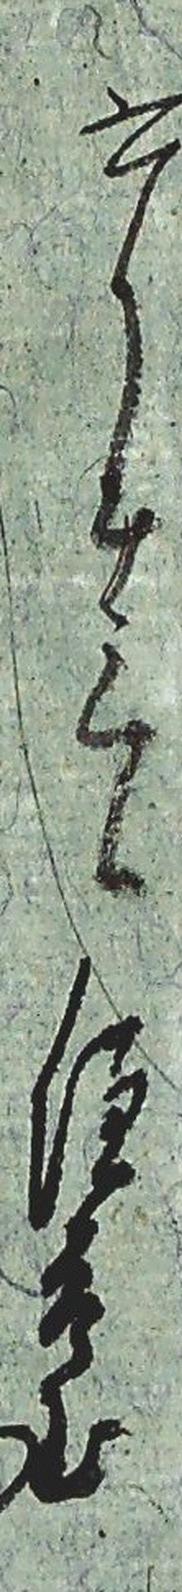六月十三日住吉屋
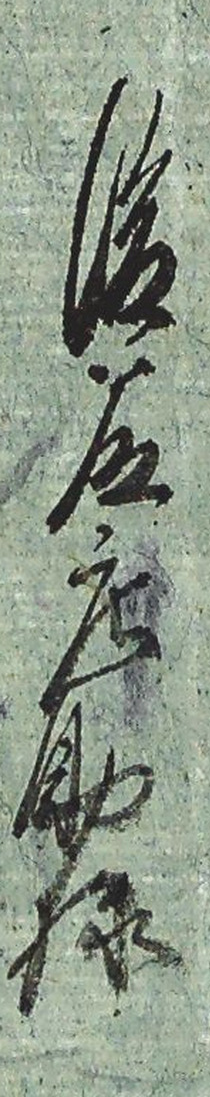後藤庄助様

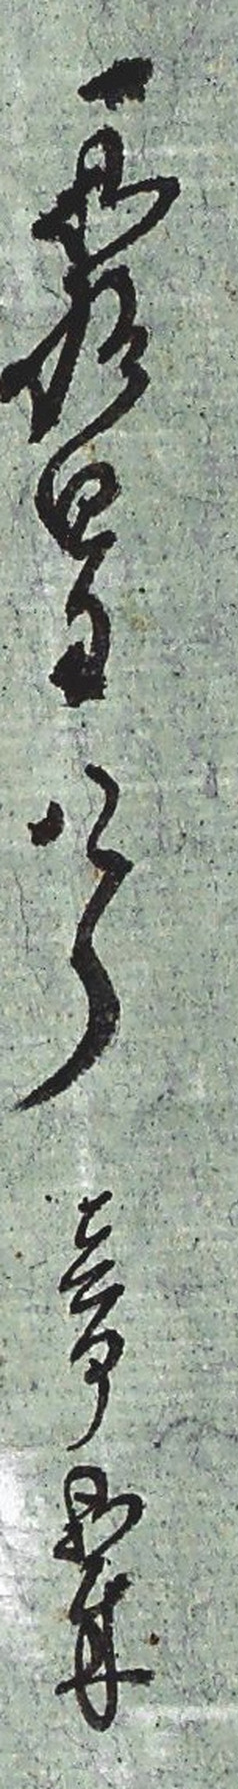一弐拾四匁八厘壱歩弐朱
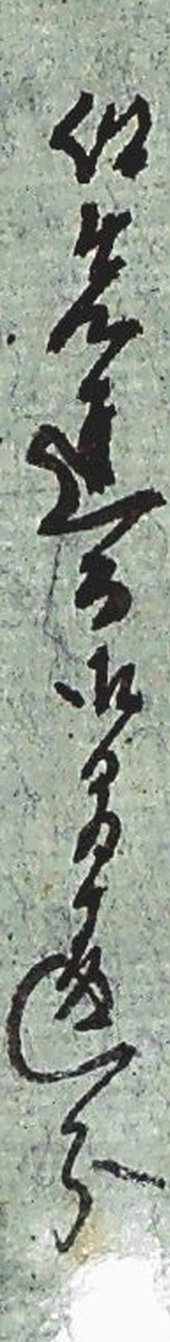但先達て御間違分
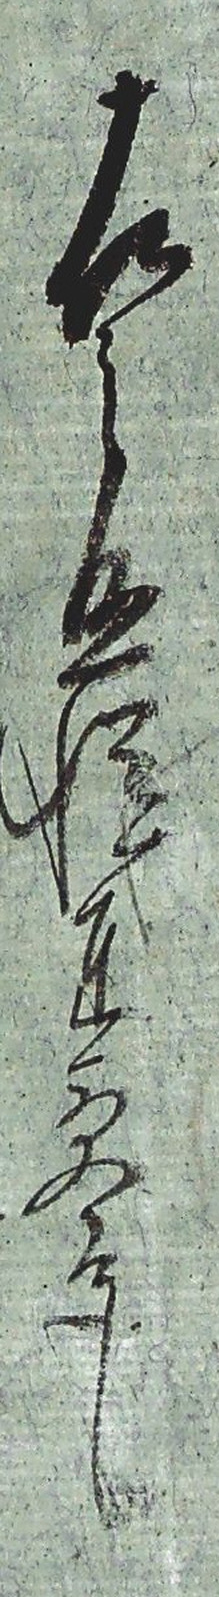右之通慥奉受取候
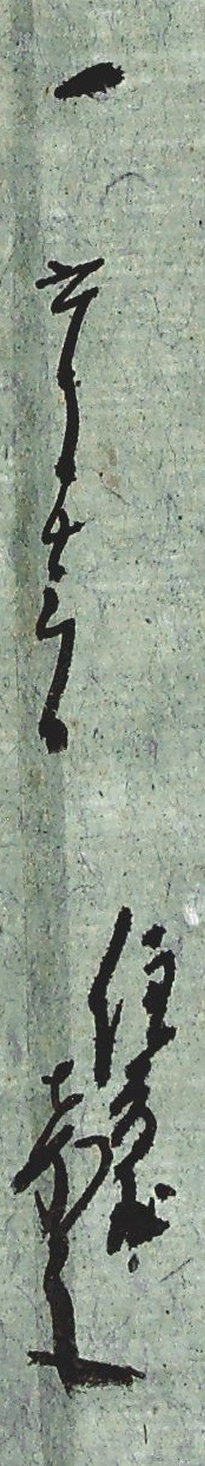一六月十三日住吉屋
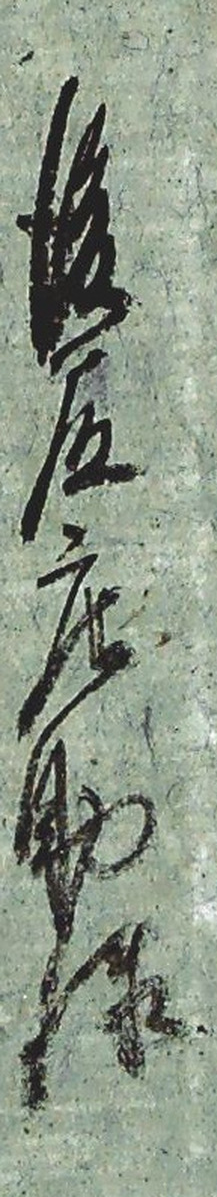後藤庄助様
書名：名東郡中諸割賦元帳
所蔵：鳴門教育大学 Naruto University of Education
